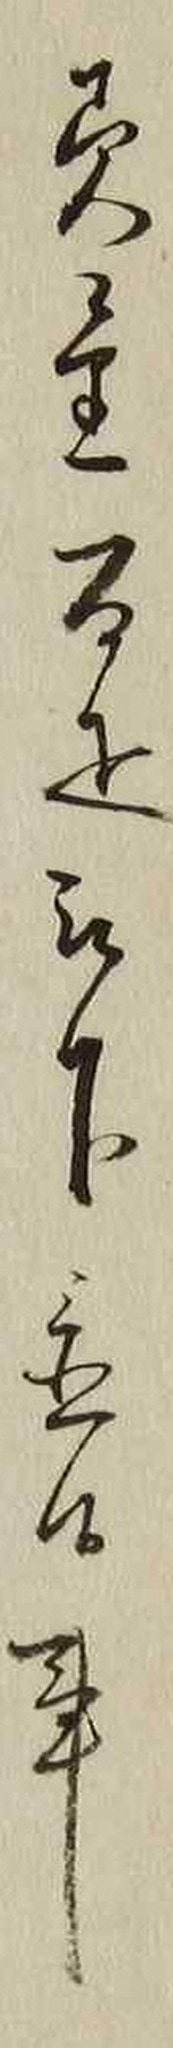美金百疋被下置候事
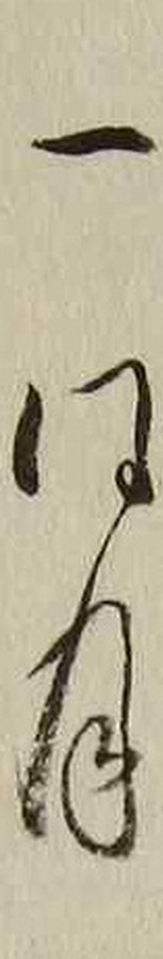一同月
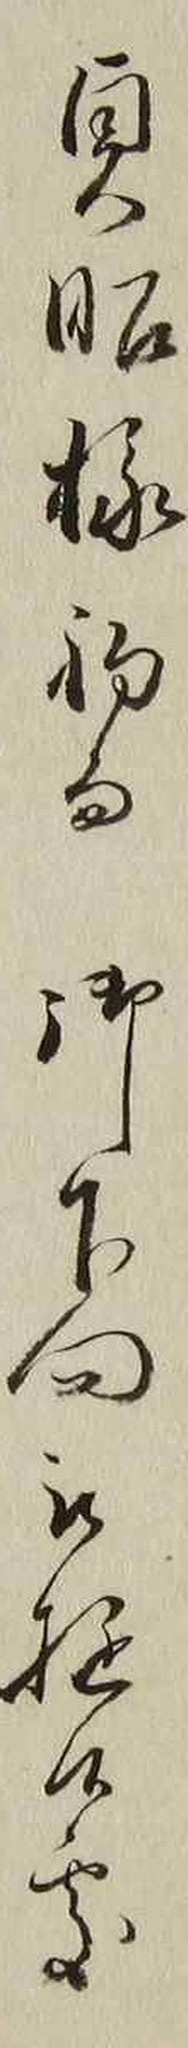貞昭様初而御下向被遊候処
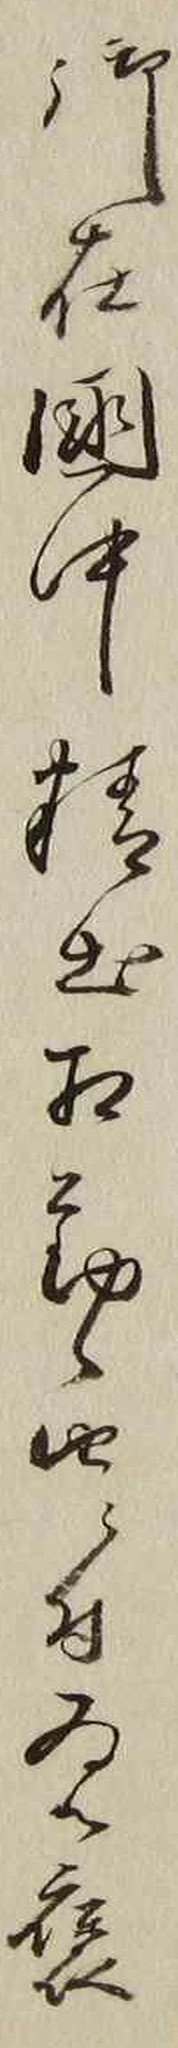御在国中精出相勤候由ニ付為御褒
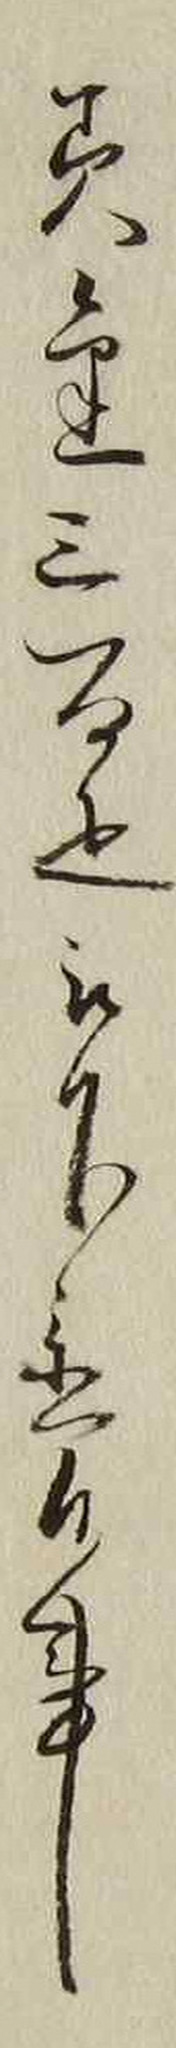美金三百疋被下置候事
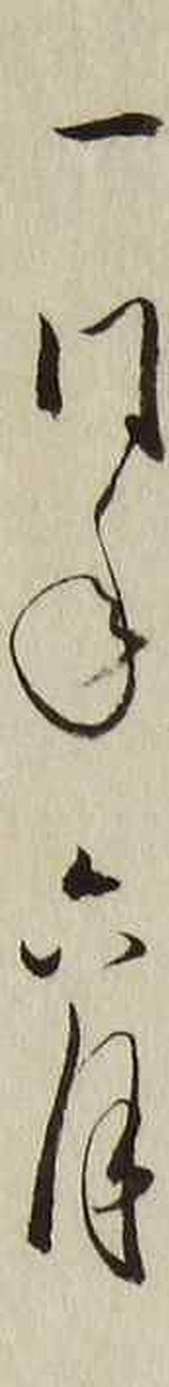一同年六月
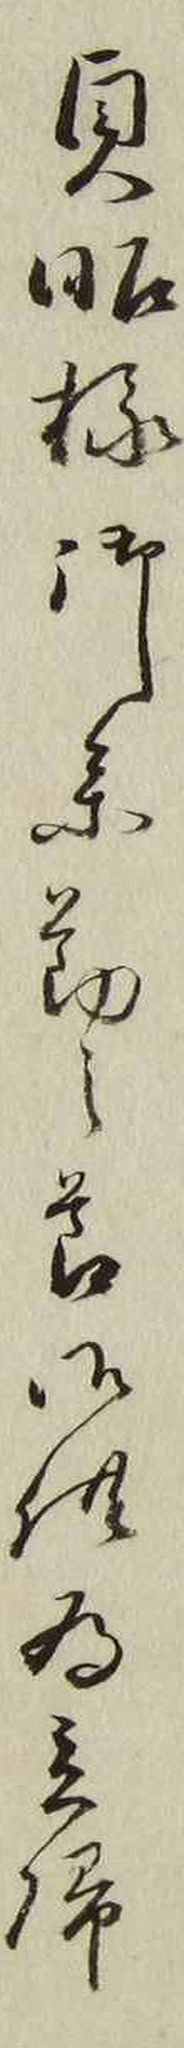貞昭様御参勤之節御供為立帰
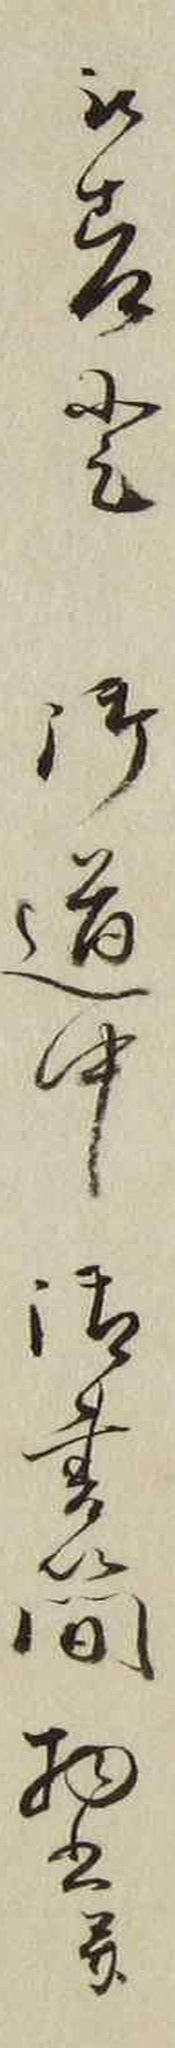被差登御道中御書簡物書幷
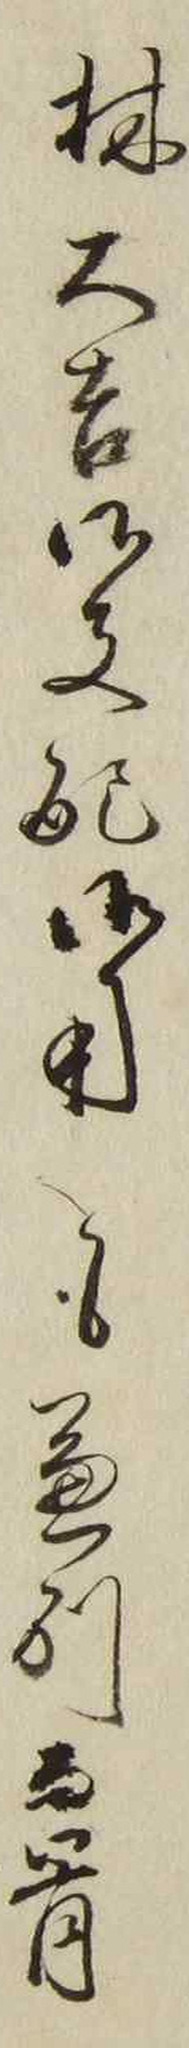林大吉御支配御用をも兼別而骨

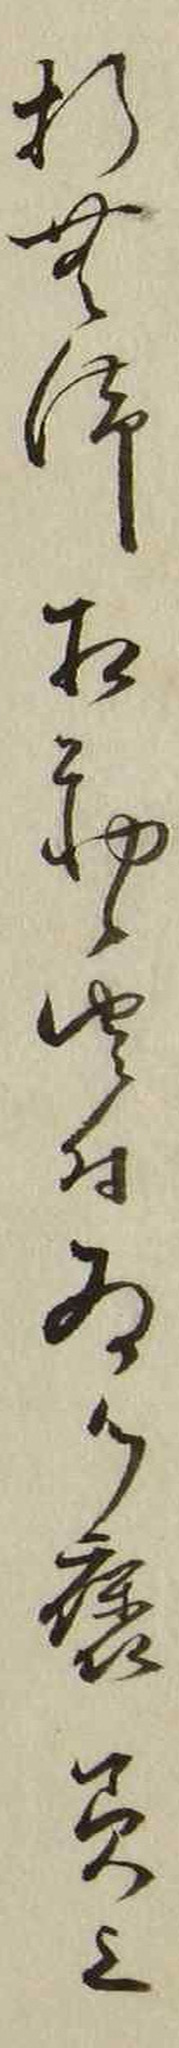折無滞相勤候由付為御褒美上
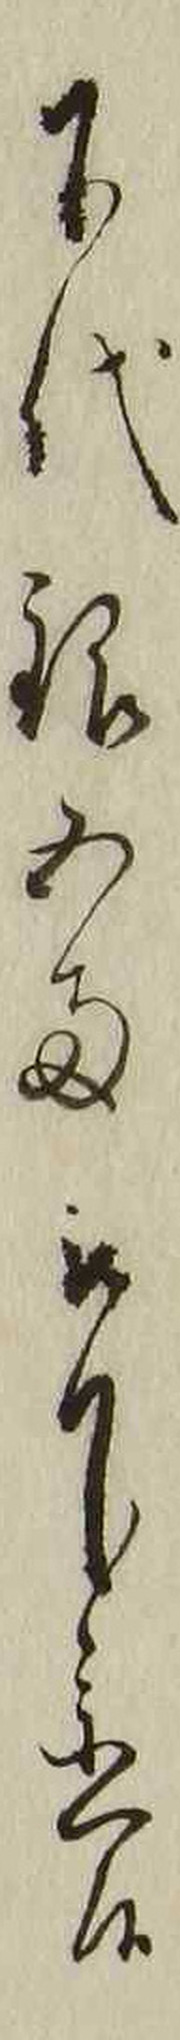下代銀五両被下置候
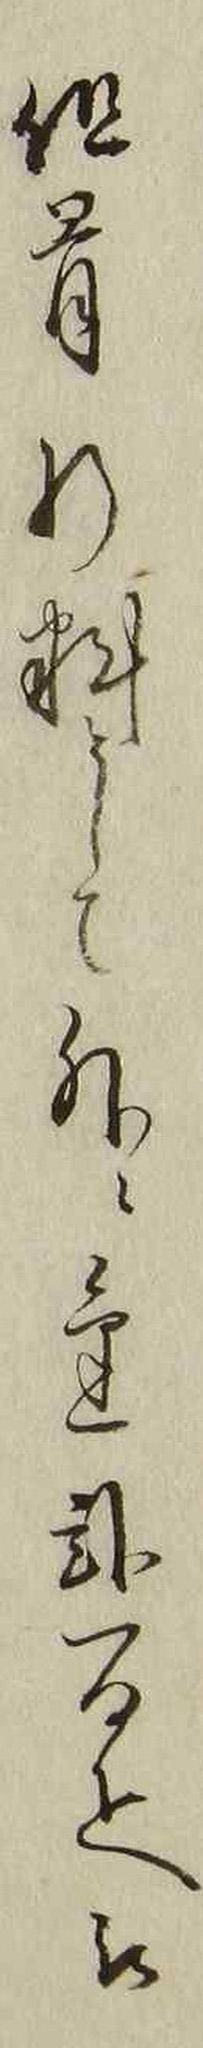但骨折料として外ニ金弐百疋被
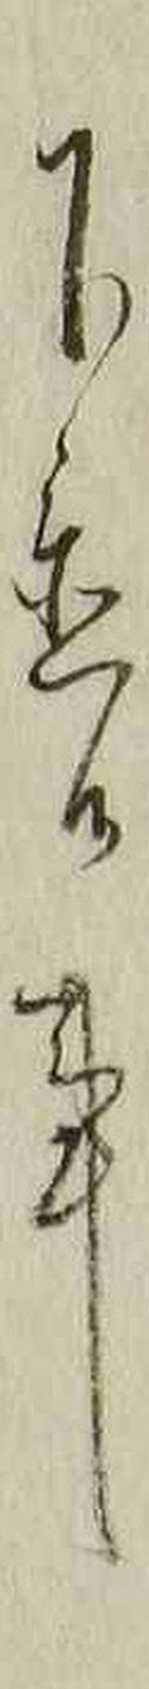下置候事
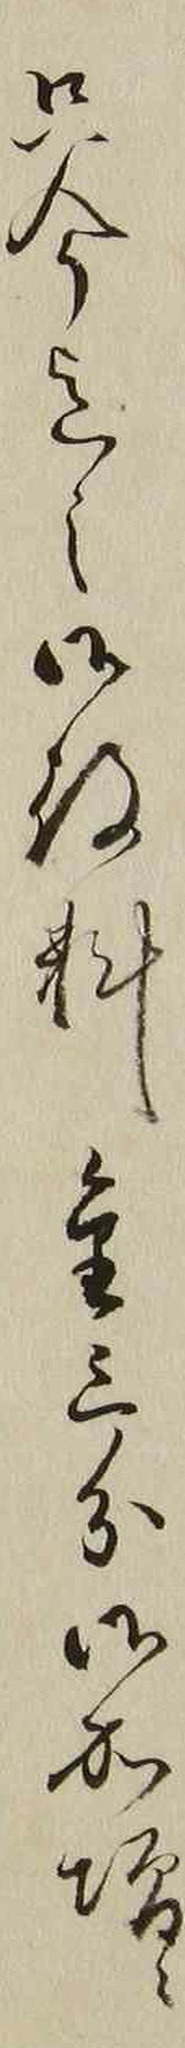只今迄之御役料金三分御加増ニ
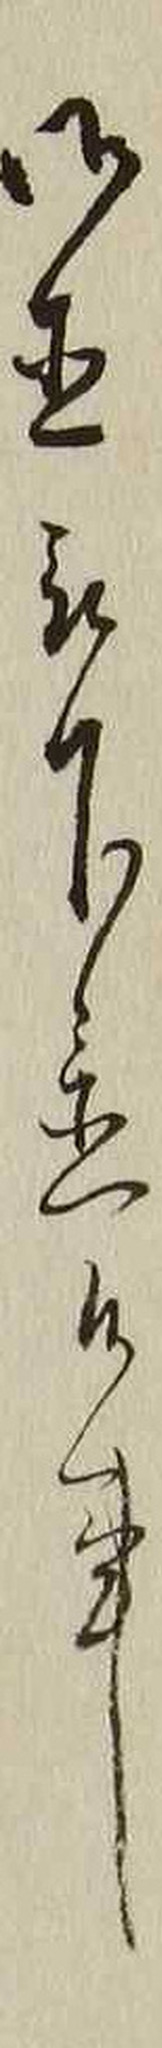御直被下置候事
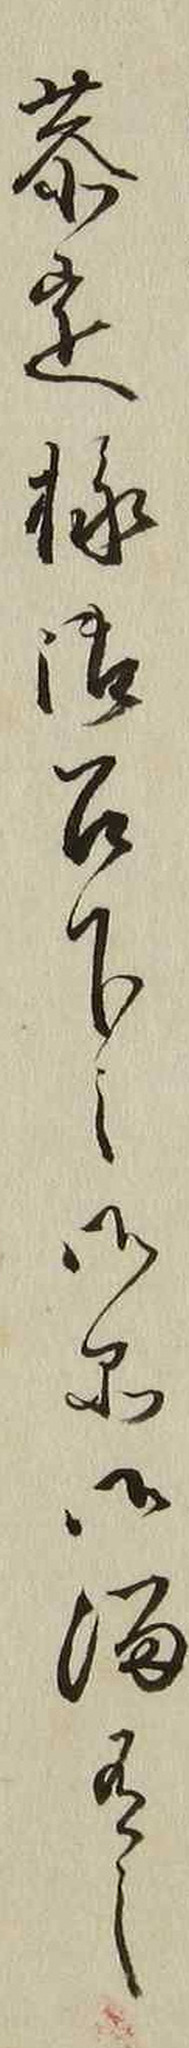恭定様御召下之御品御酒有之
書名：諸士系譜　巻之10　い之部10
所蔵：会津若松市立会津図書館
